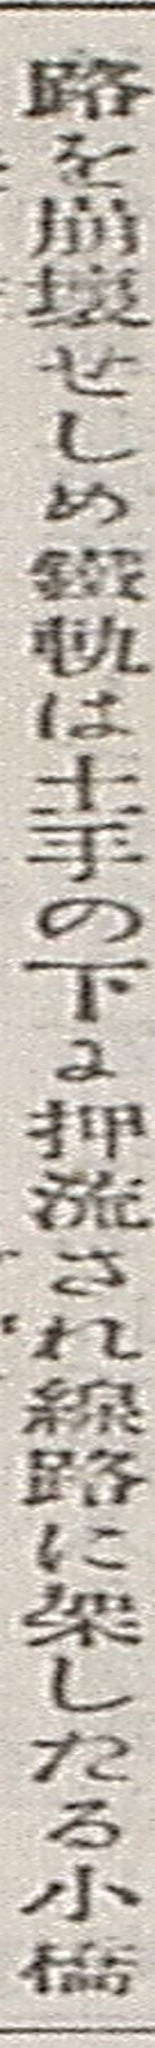路を崩壊せしめ鉄軌は土手の下に押流され線路に架したる小橋
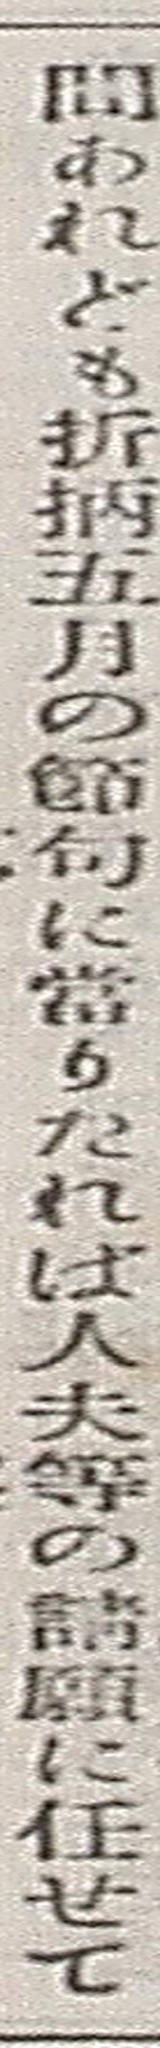間あれども折柄五月の節句に当りたれば人夫等の請願に任せて
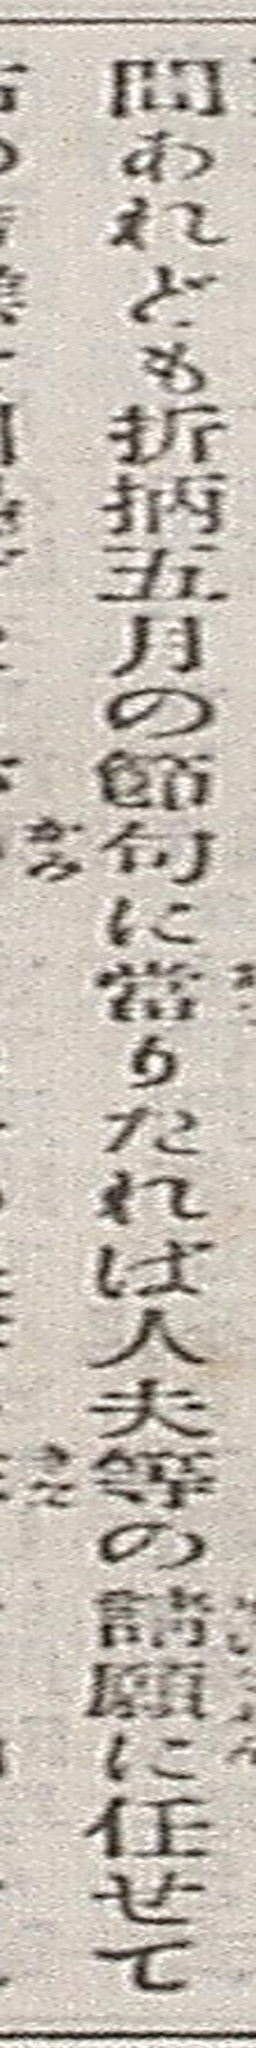間あれども折柄五月の節句に当りたれば人夫等の請願に任せて
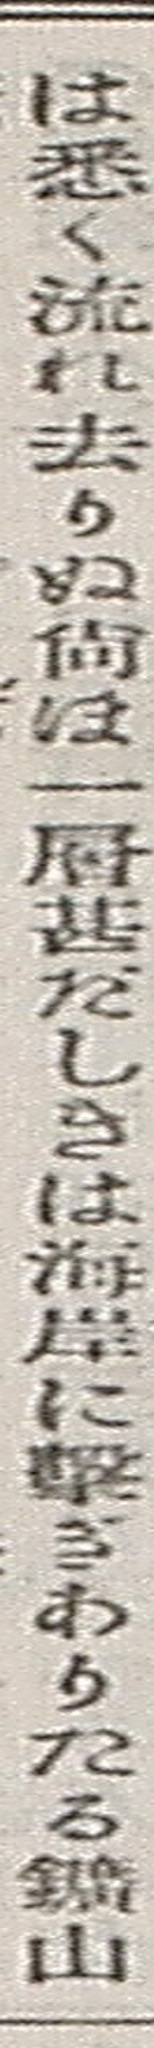は悉く流れ去りぬ尚ほ一層甚だしきは海岸に繋ありたる鉱山
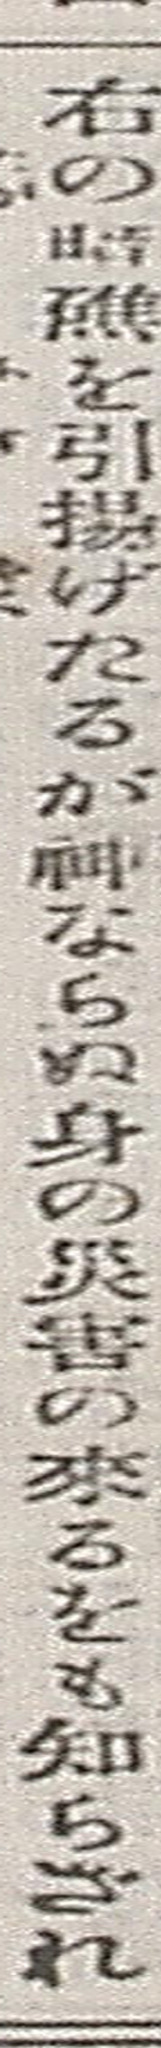右の暗礁を引揚げたるが神ならぬ身の災害の来るを知らざれ
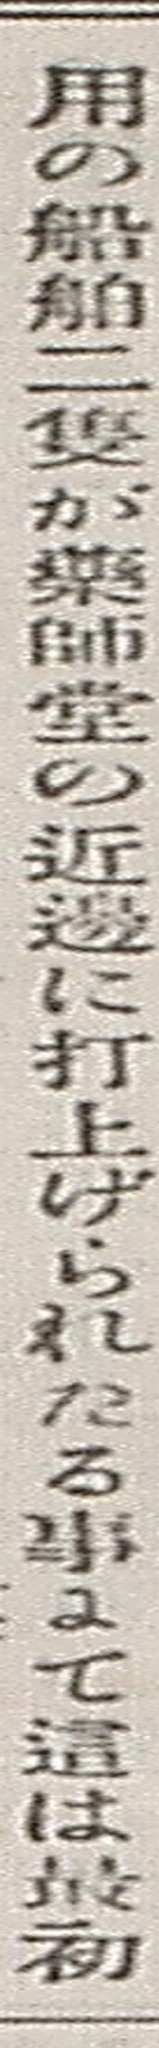用の船舶二隻が薬師堂の近辺に打上げられたる事にて這は最初
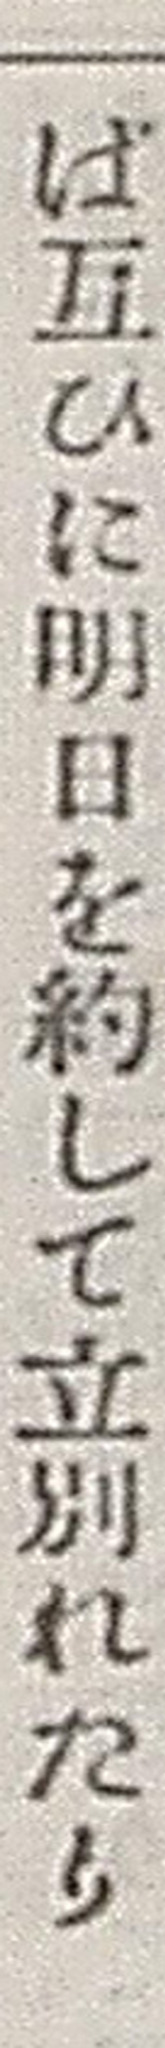ば互ひに明日を約して立別れたり
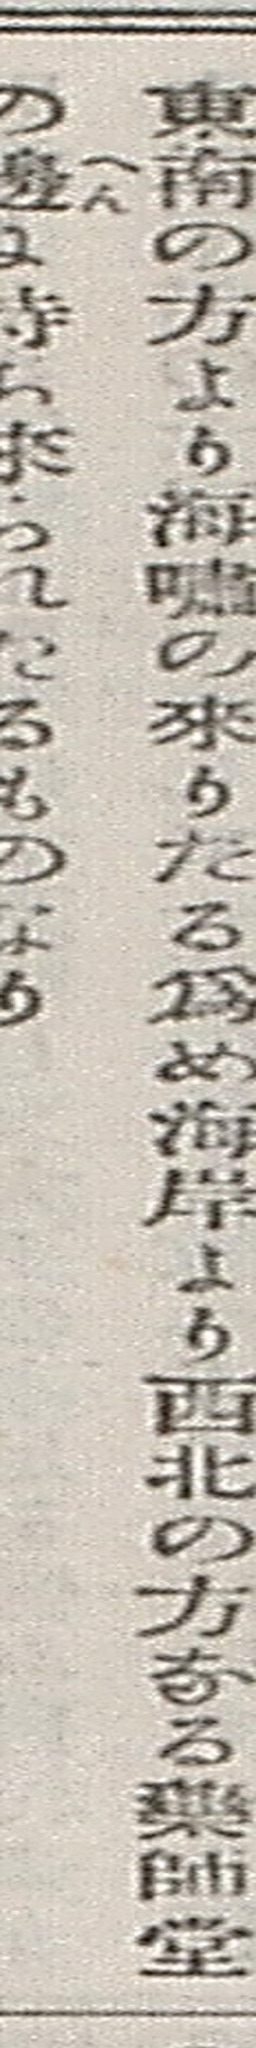の辺に持ち来られたるものなり
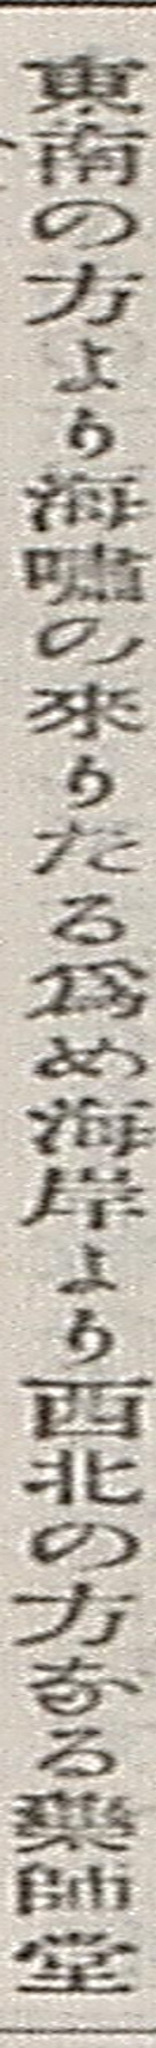東南の方より海嘯の来りたる為め海岸より西北の方なる薬師堂
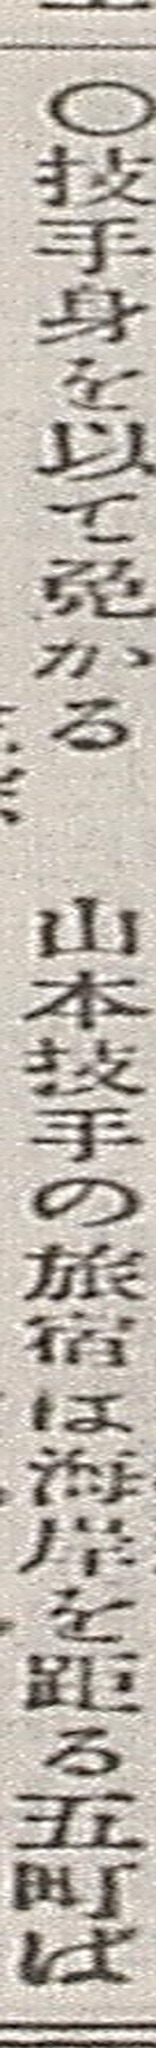○技手身を以て免かる山本技手の旅宿は海岸を距る五町ば
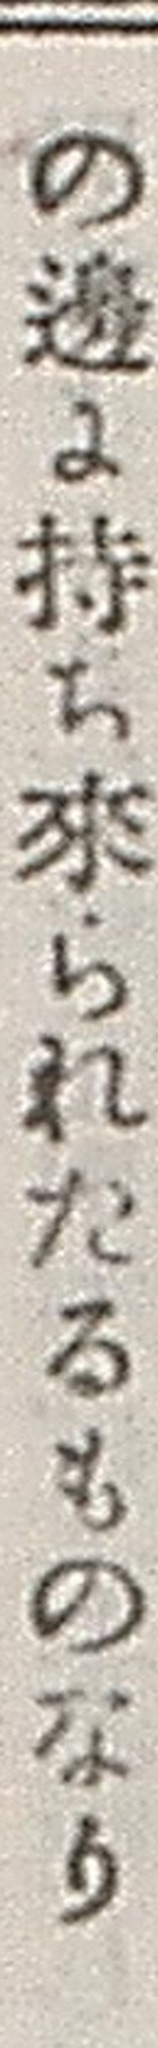の辺に持ち来られたるものなり
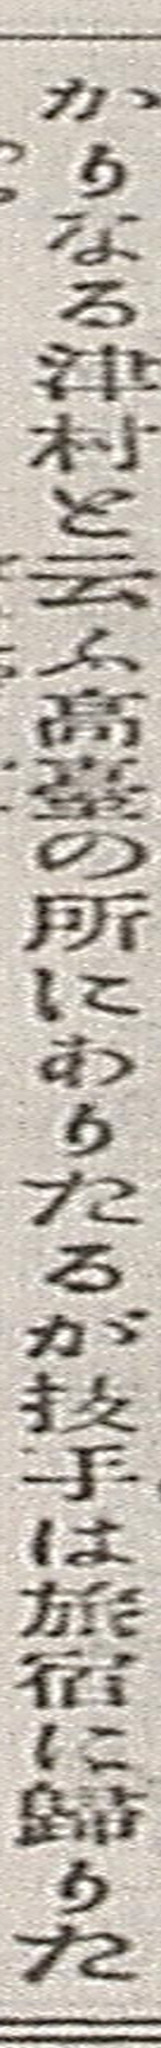かりなる津村と云ふ高台の所にありたるが技手は旅宿に帰りた
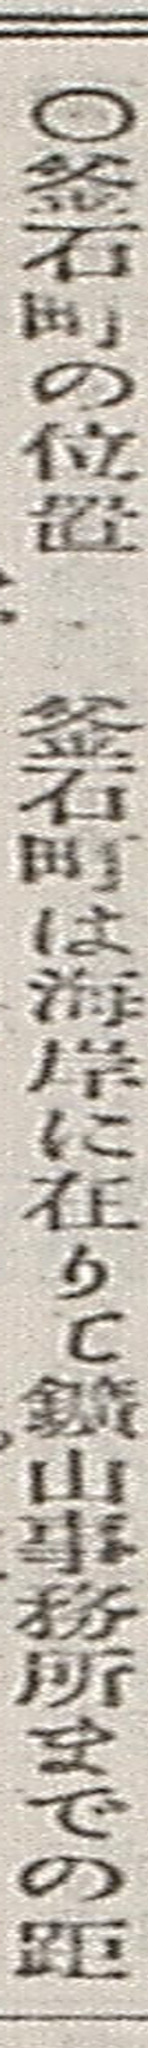○釜石町の位置釜石町は海岸に在りて鉱山事務所までの距
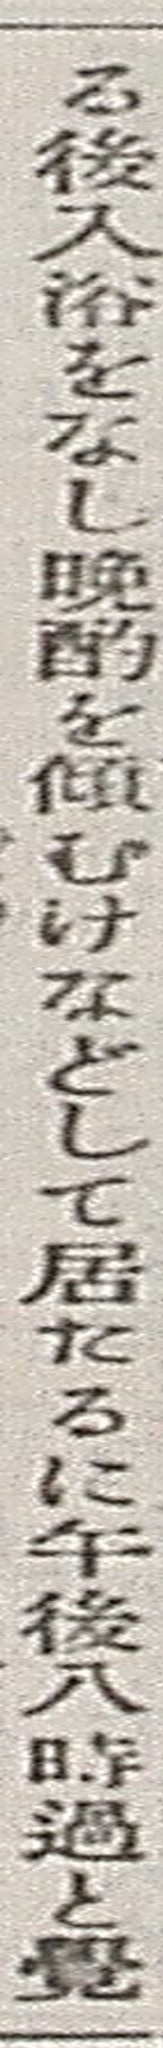る後入浴をなし晩酌を傾むけなどして居たるに午後八時過と覚
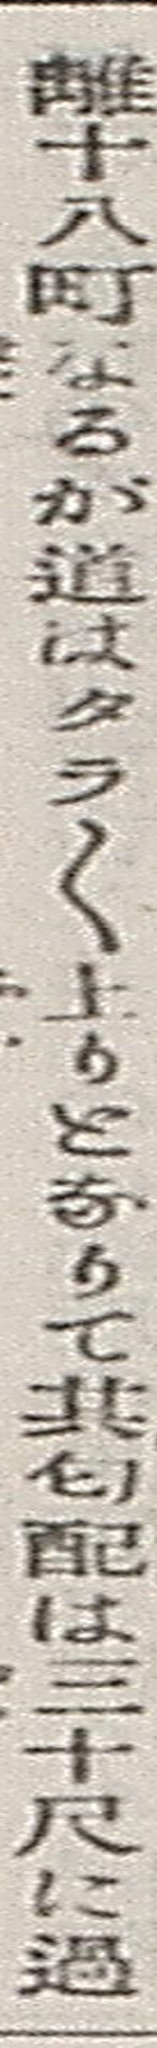離十八町なるが道はタラ〳〵上りとなりて其勾配は三十尺に過
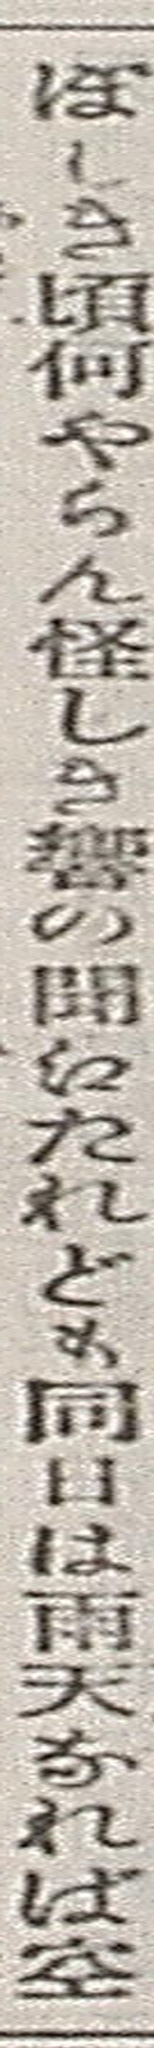ぼしき頃何やらん怪しき響の聞えたれども同日は雨天なれば空
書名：風俗畫報臨時増刊第百二十號　大海嘯被害録（下）
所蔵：東京大学地震研究所図書室 Earthquake Research Institute Library, The University of Tokyo, JAPAN
